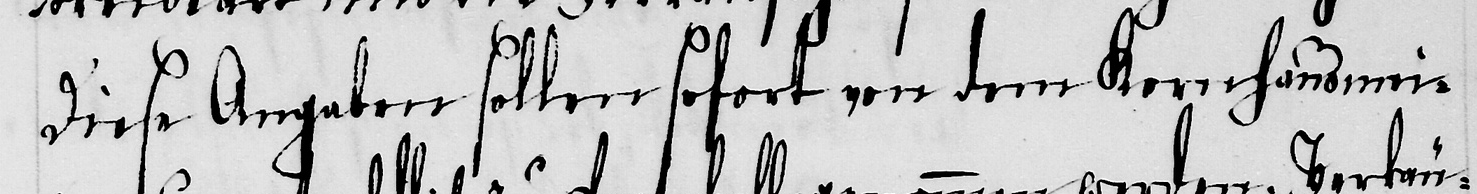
Diese Angaben sollen sofort von dem Kornhausmei¬
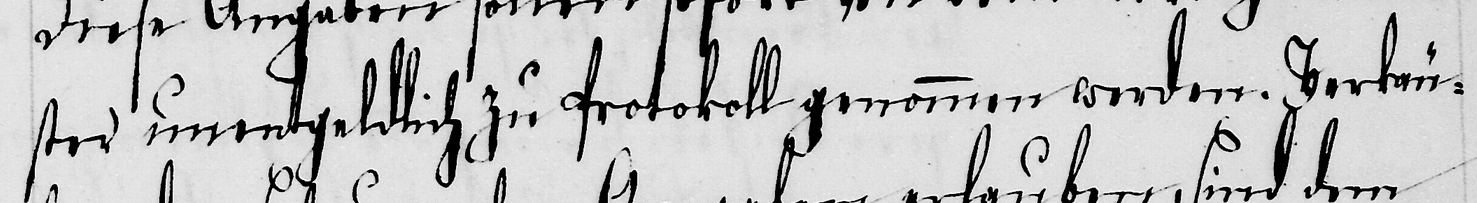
ster unentgeldlich zu Protokoll genommen werden. Verkäu¬
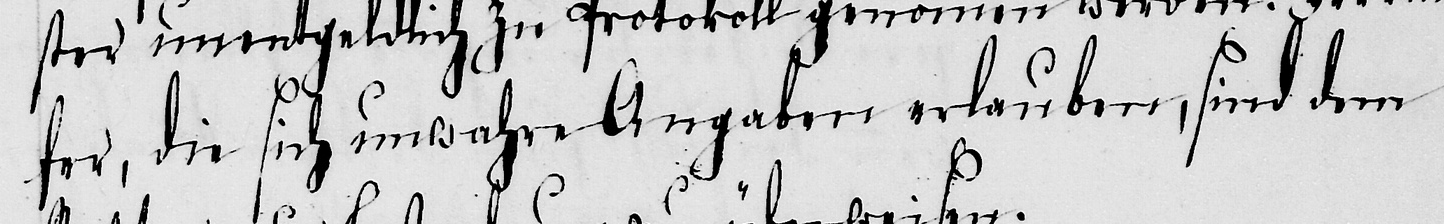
fer, die sich unwahre Angaben erlauben, sind dem
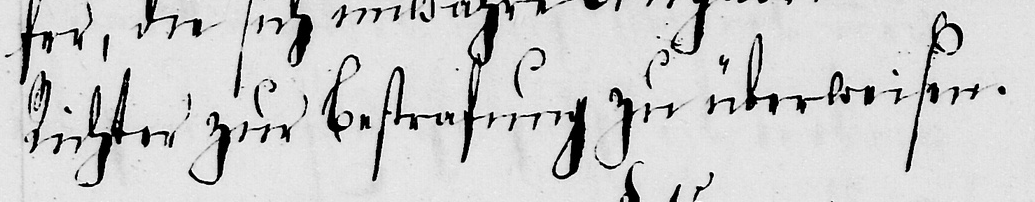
Richter zur Bestrafung zu überweisen.
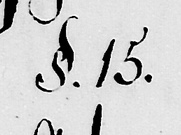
§.15.
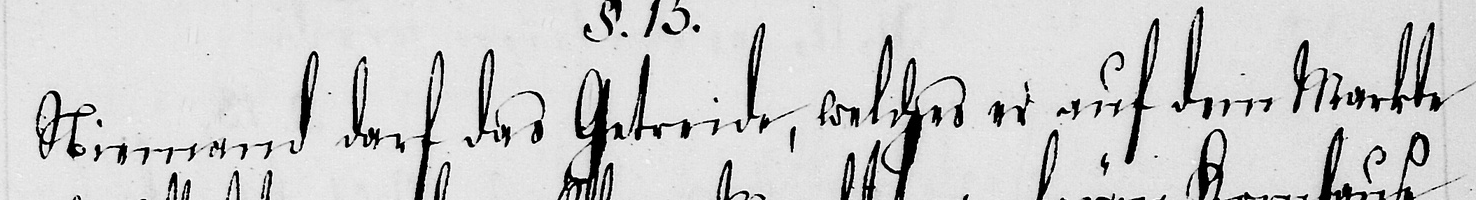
Niemand darf das Getreide, welches er auf dem Markte
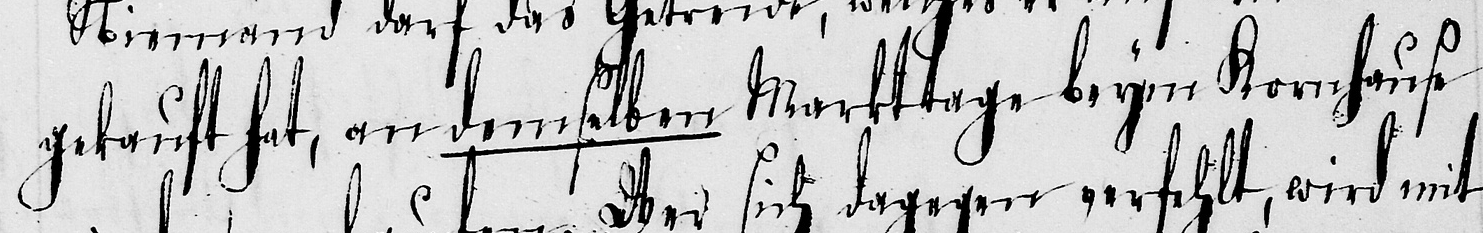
gekauft hat, an demselben Markttage beym Kornhause
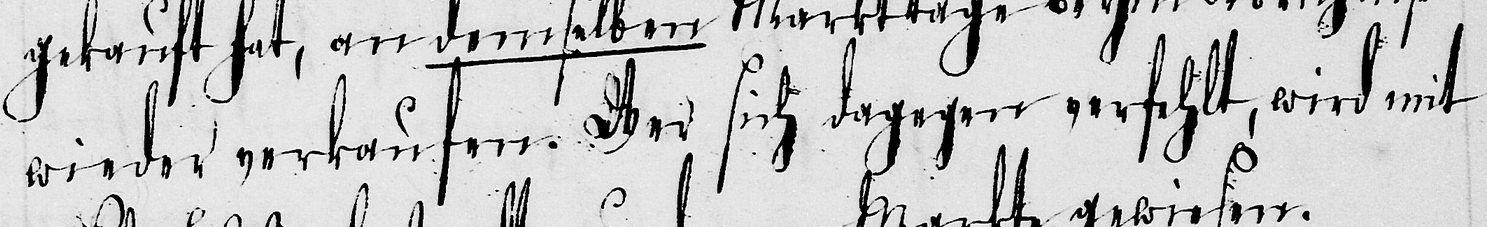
wieder verkaufen. Wer sich dagegen verfehlt, wird mit
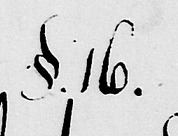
§.16.
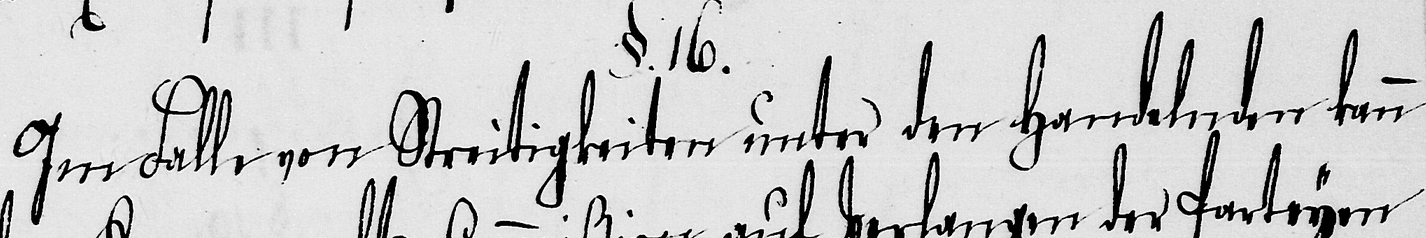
Im Falle von Streitigkeiten unter den Handelnden
